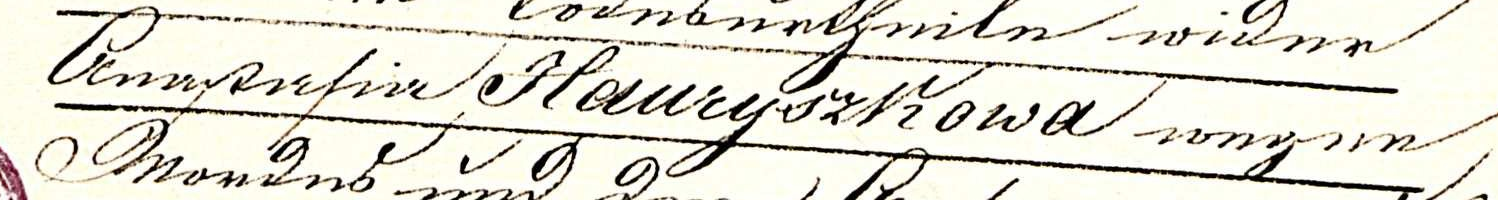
Anastasia Hauryszkowa wegen
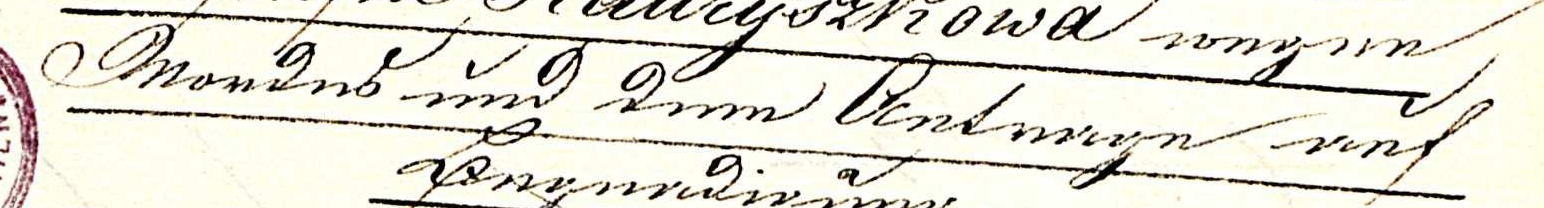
Mordes und dem Antrage auf
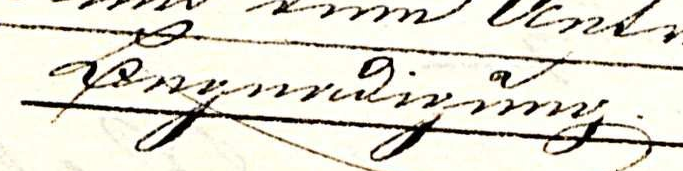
Begnadigung.
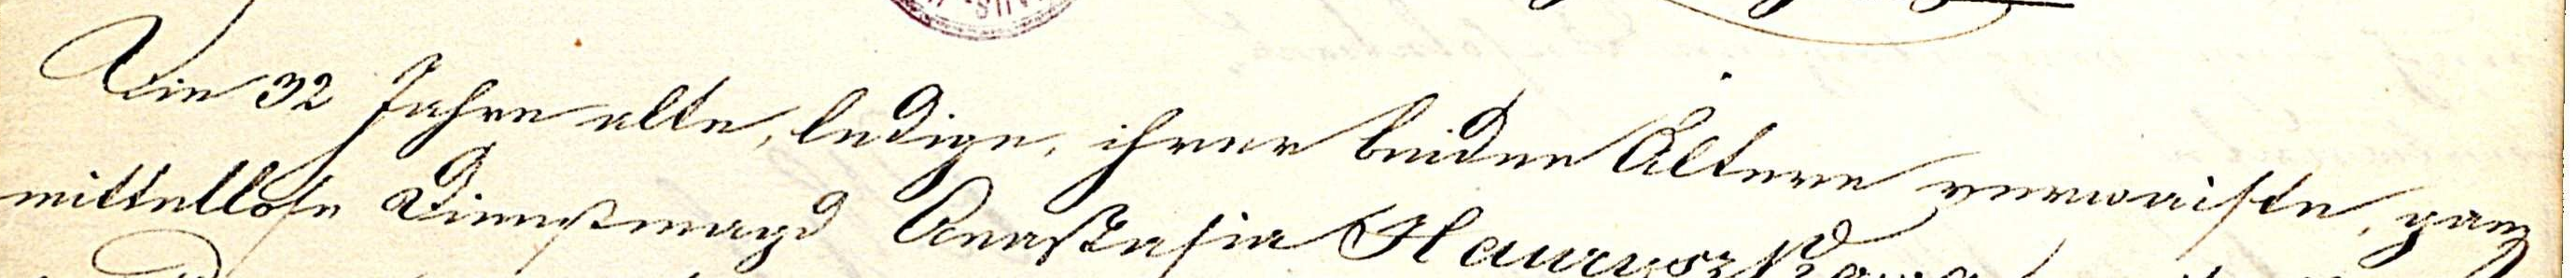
Die 32 Jahre alte, ledige, ihrer beiden Ältern verwaiste, ganz
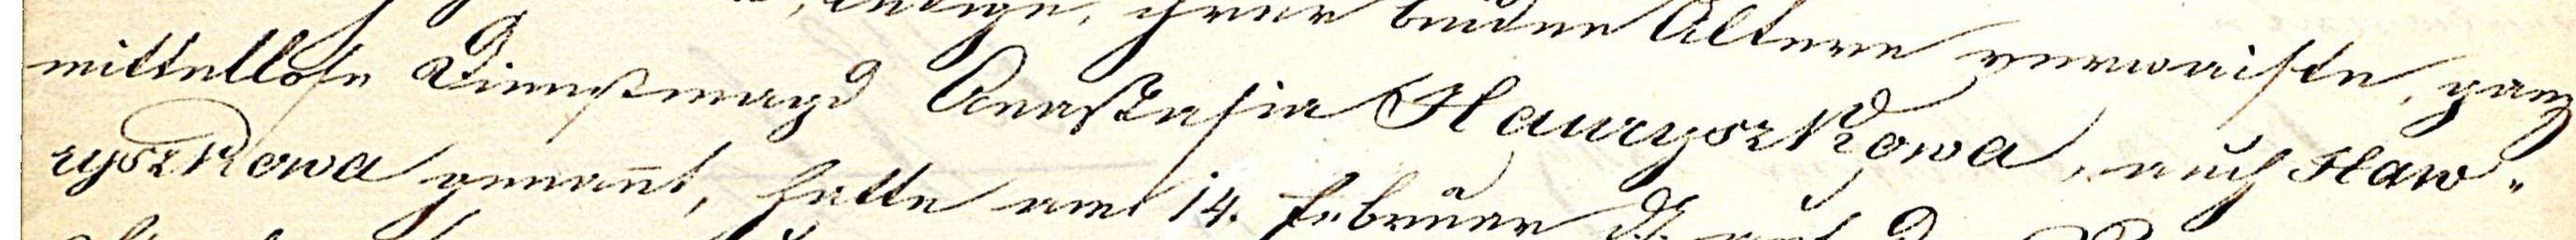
mittellose Dienstmagd Anastasia Hau¬
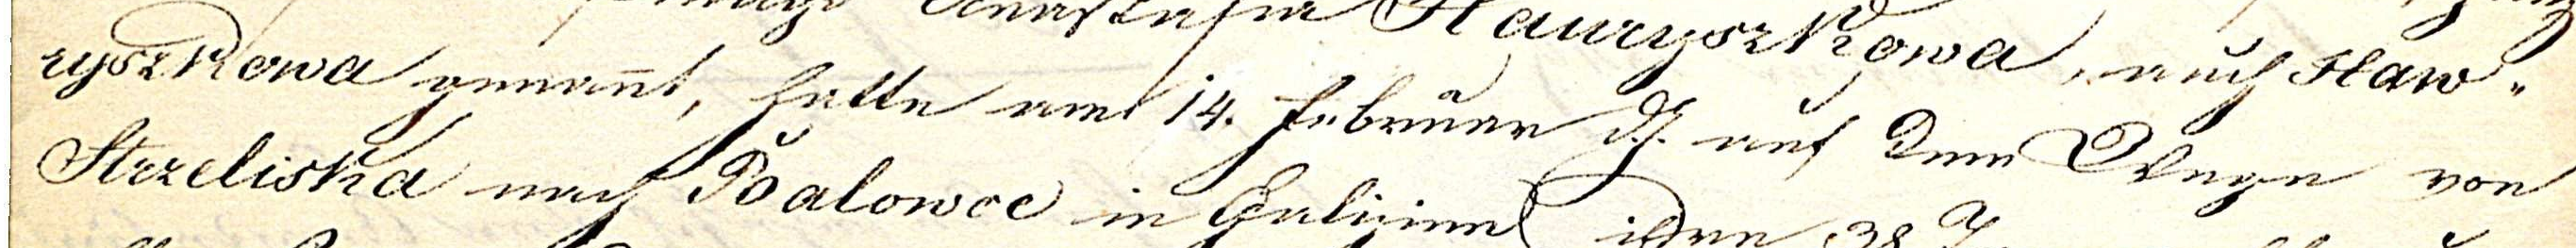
ryszkowa, auch Hawryszkowa genannt, hatte am 14. Februar J. auf dem Wege von
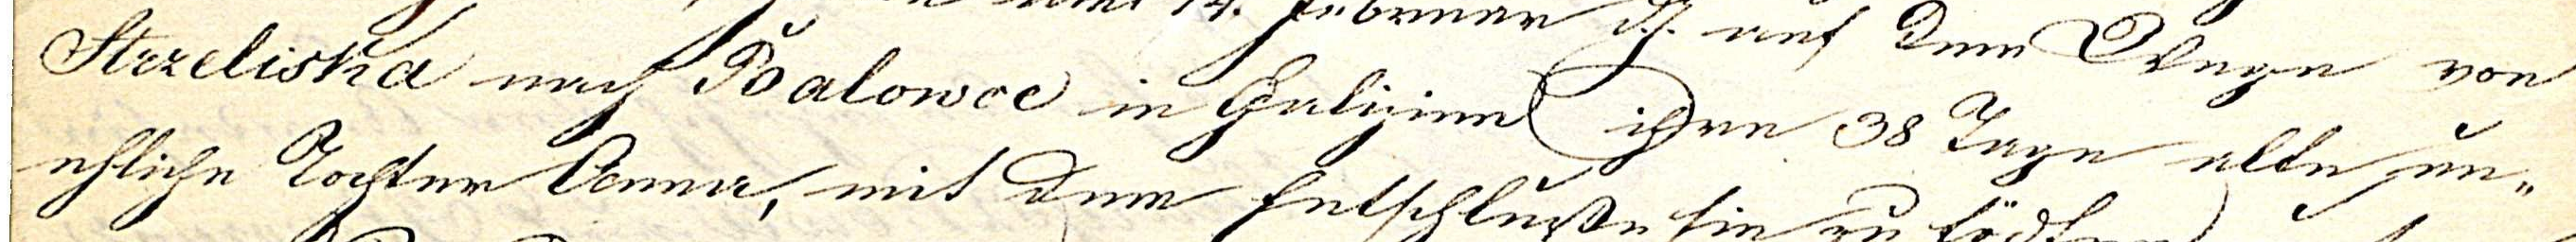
Strzeliska nach Balowce [could be Poalowce] in Galizien ihre 38 Tage alte un¬
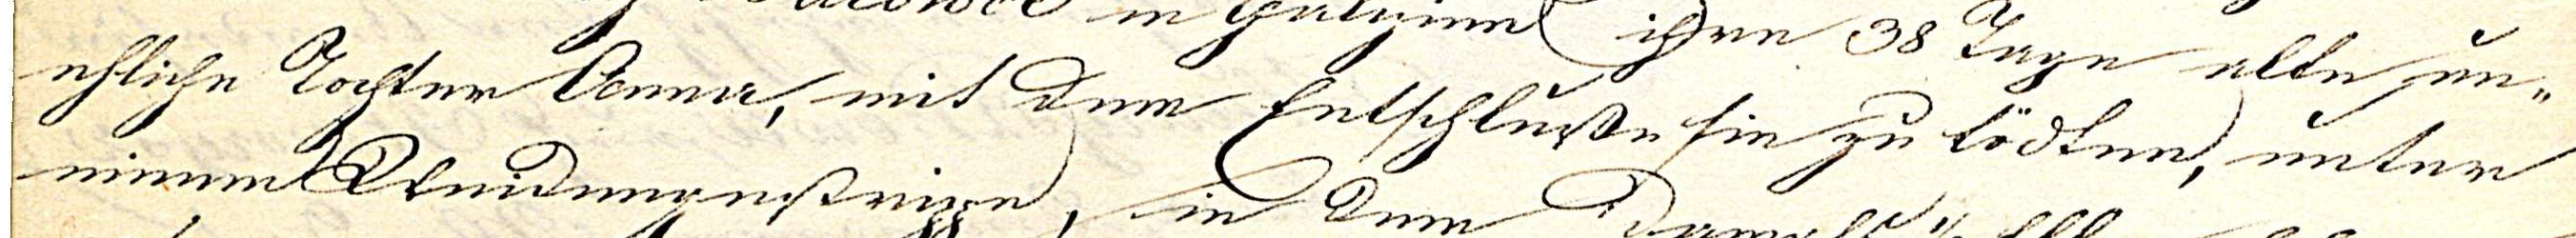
ehliche Tochter Anna, mit dem Entschluße sie zu tödten, unter
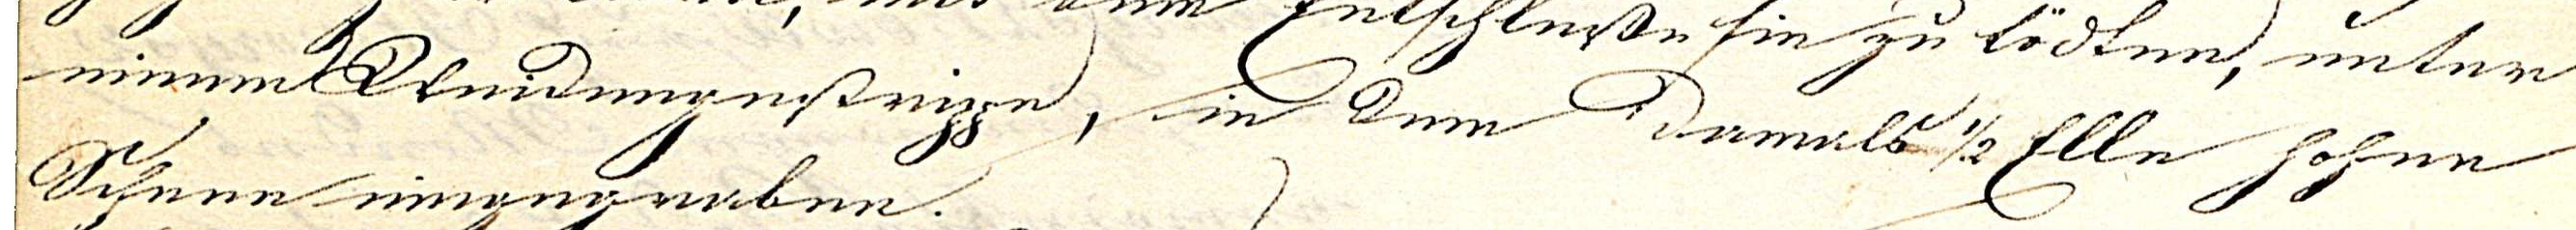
einem Weidengestrippe, in dem damals ½ Elle hohen
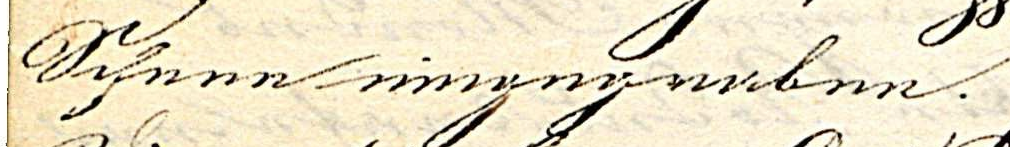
Schnee eingegraben.
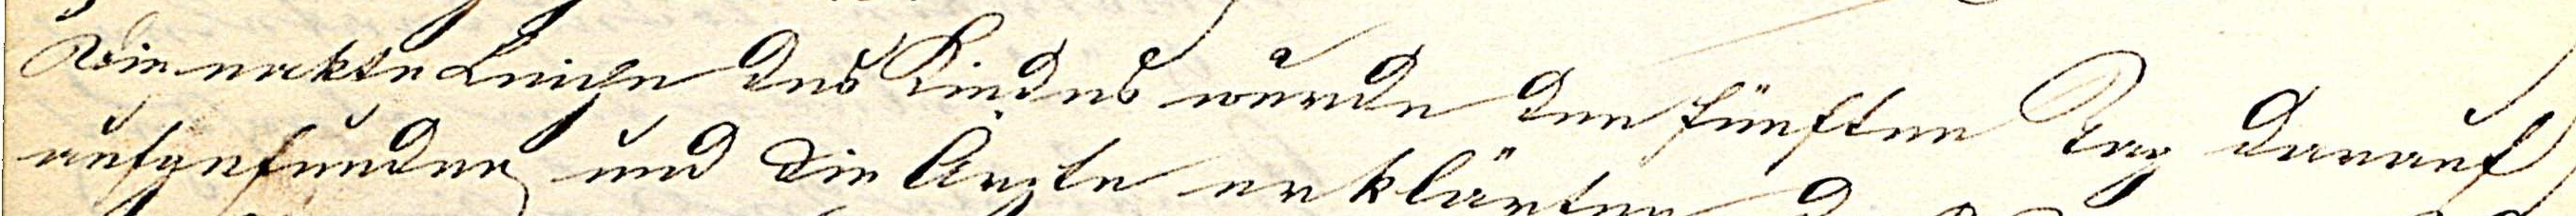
Die nakte Leiche des Kindes wurde den fünften Tag darauf
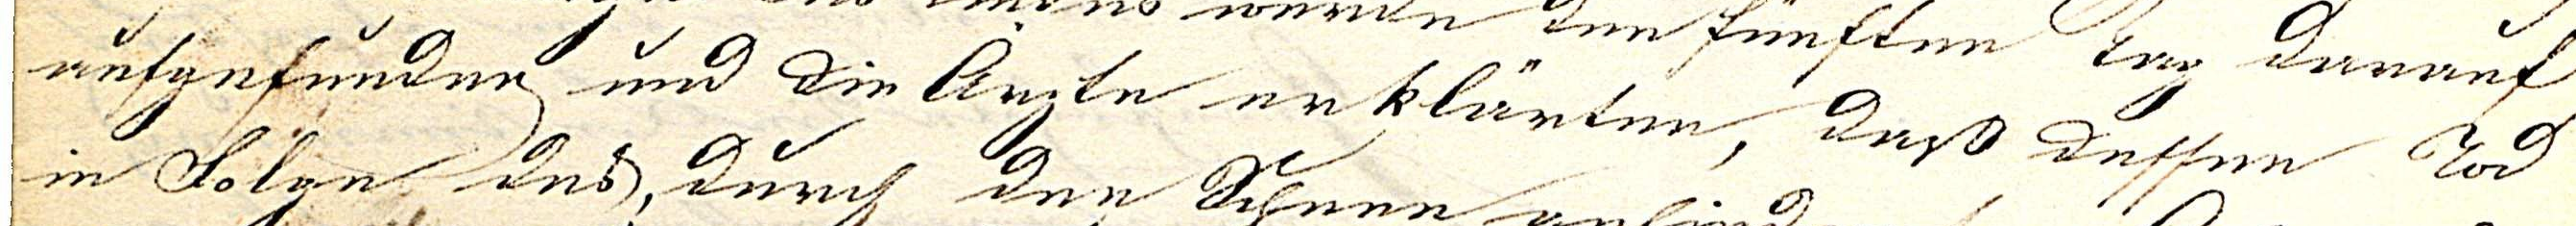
aufgefunden und die Ärzte erklärten, daß dessen Tod
